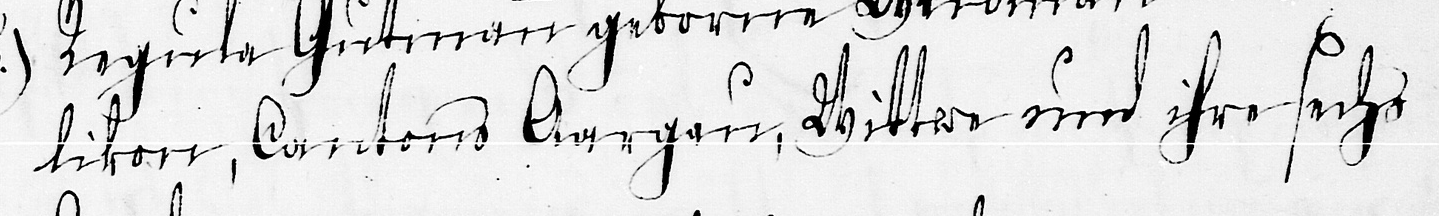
likon, Cantons Aargau, Wittwe und ihre sechs
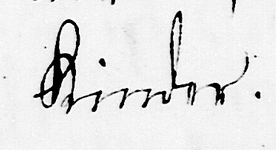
Kinder.
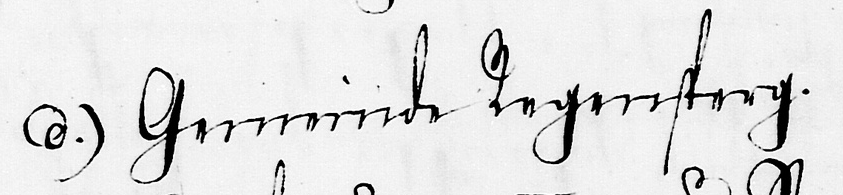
d.) Gemeinde Regensperg.
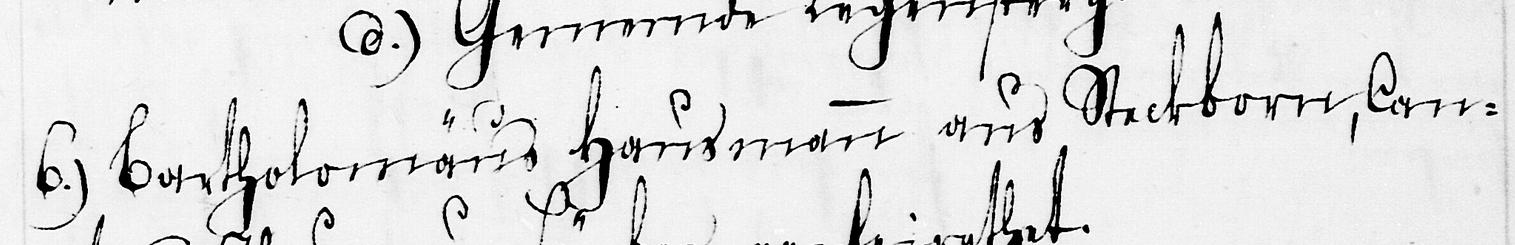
6.) Bartholomäus Hausmann aus Steckborn, Can¬
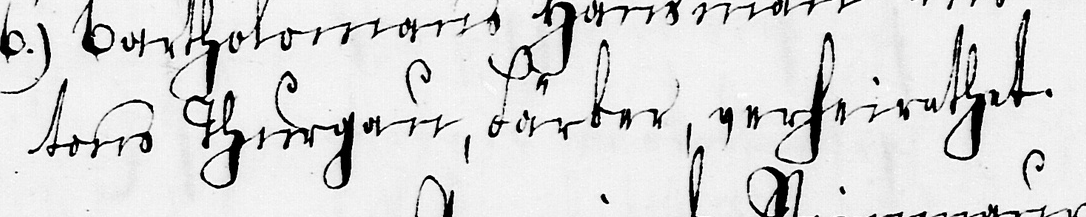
tons Thurgau, Färber, verheirathet.
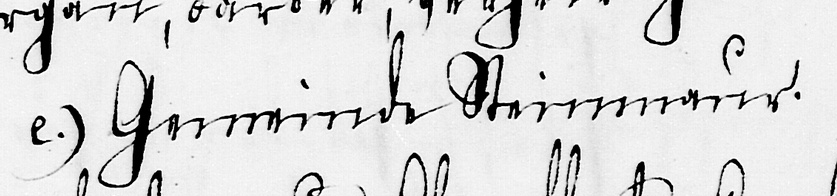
e.) Gemeinde Steinmaur.
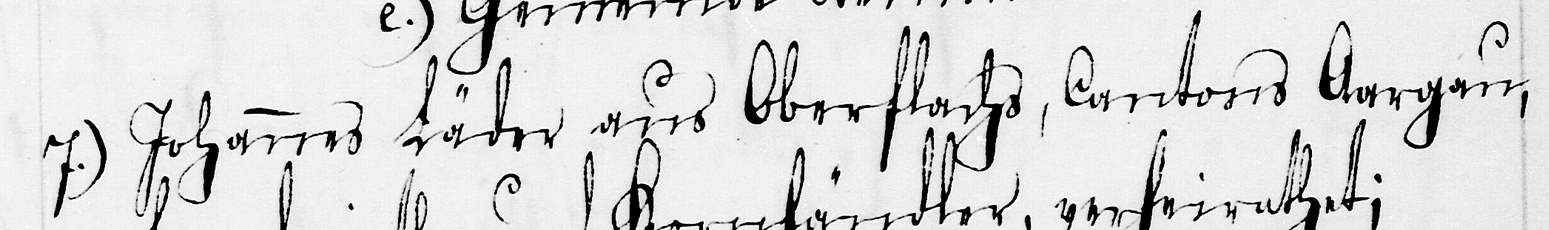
7.) Johannes Läder aus Oberflachs, Cantons Aargau,
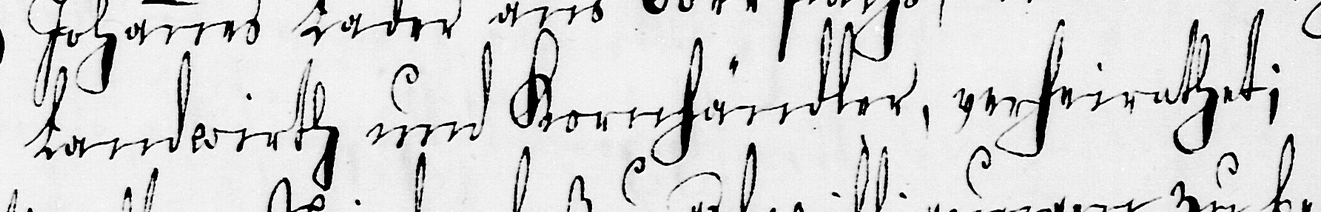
Landwirth und Kornhändler, verheirathet;
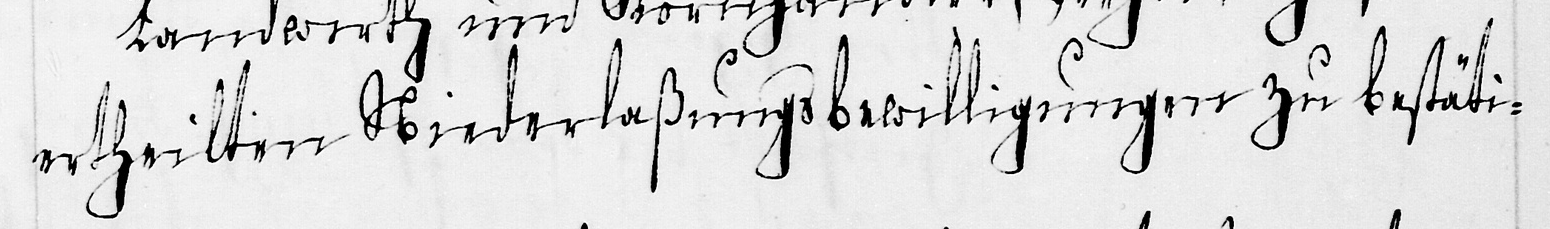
ertheilten Niederlaßungsbewilligungen zu bestäti¬
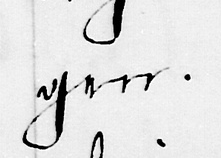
gen.
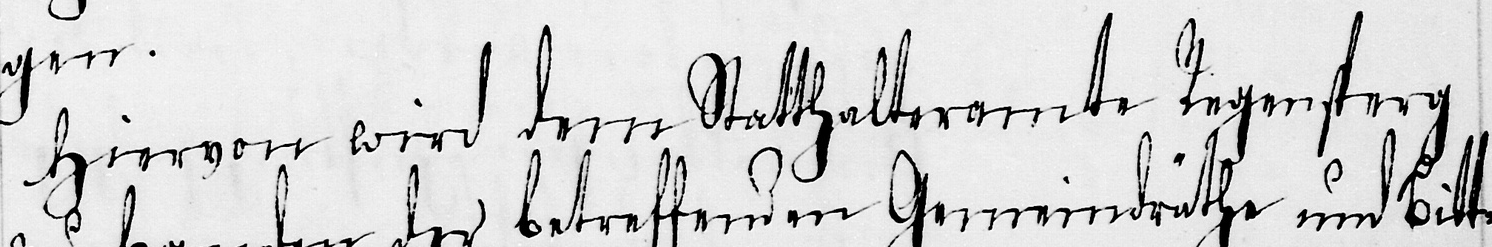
Hiervon wird dem Statthalteramte Regensperg
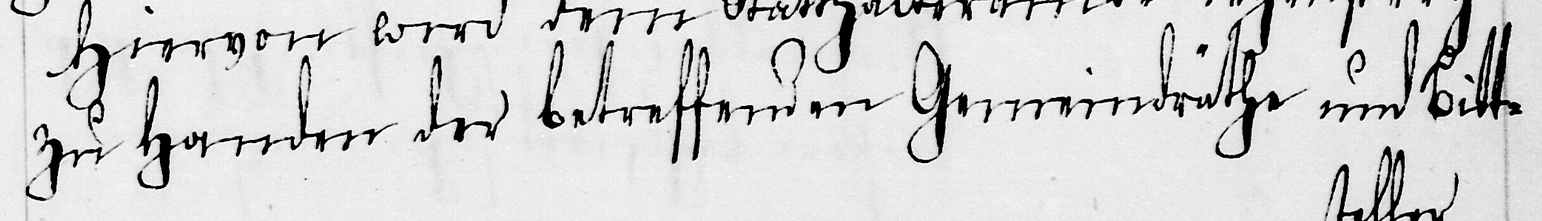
zu Handen der betreffenden Gemeindräthe und Bitt-
